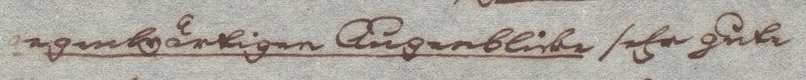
gegenwärtigen Augenblicke sehr gute
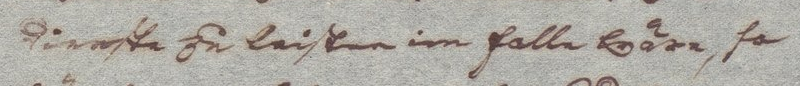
Dienste zu leisten im Falle wäre, so
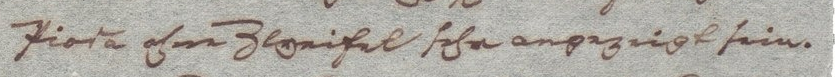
Pioda ohne Zweifel sehr angezeigt sein.
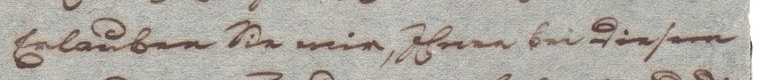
Erlauben Sie mir, Ihnen bei diesem
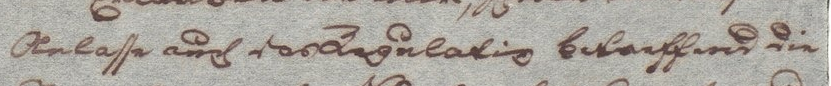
Anlasse auch das Regulativ betreffend die
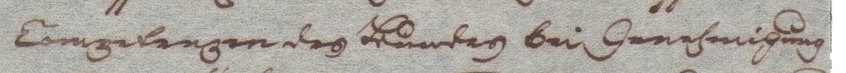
Competenzen des Bundes bei Genehmigung
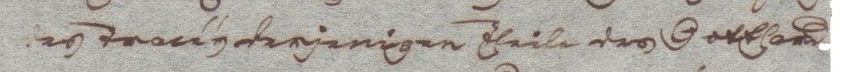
des Tracé's derjenigen Theile des Gotthard-
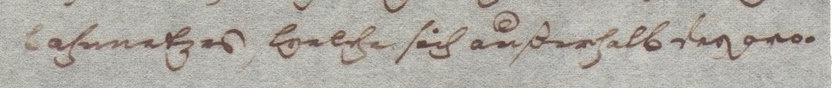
bahnnetzes, welche sich außerhalb des gro-
